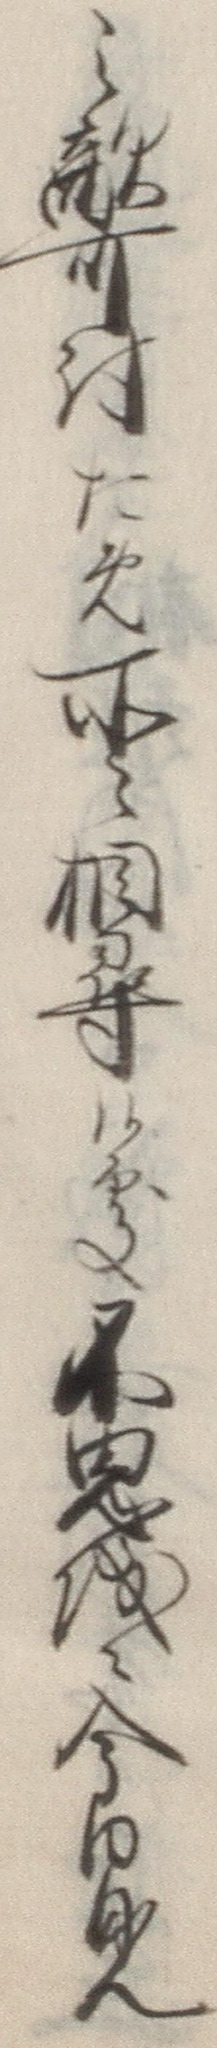之敵可討ため所々相尋候処不思儀ニ今日見
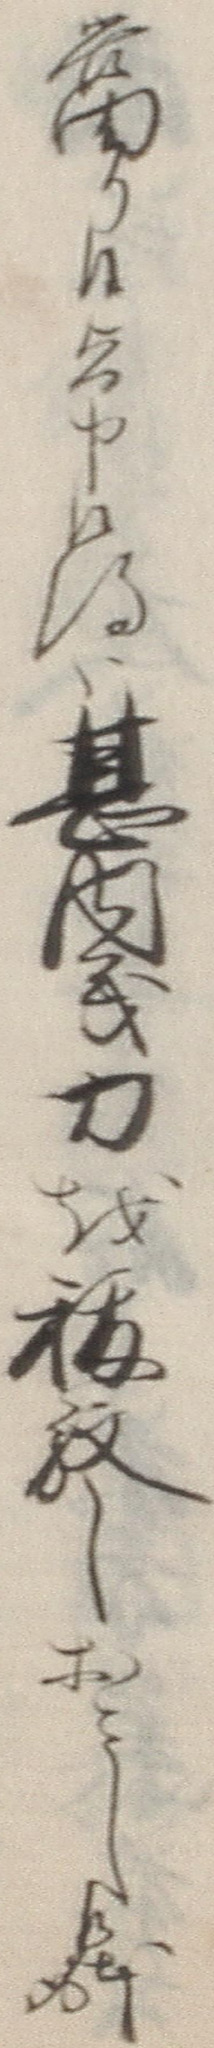当り候旨申候得ハ甚内義刀を抜放しおとし候躰
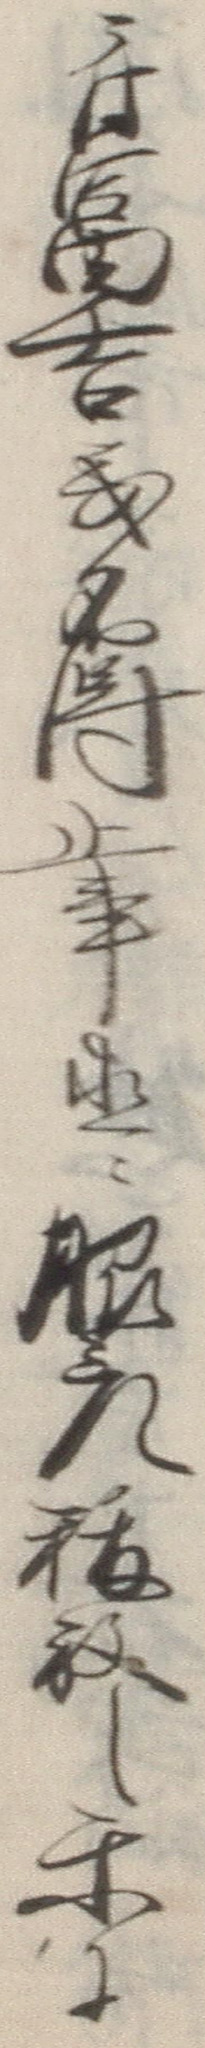ニ付富吉義不得止事直ニ脇差抜放し互に
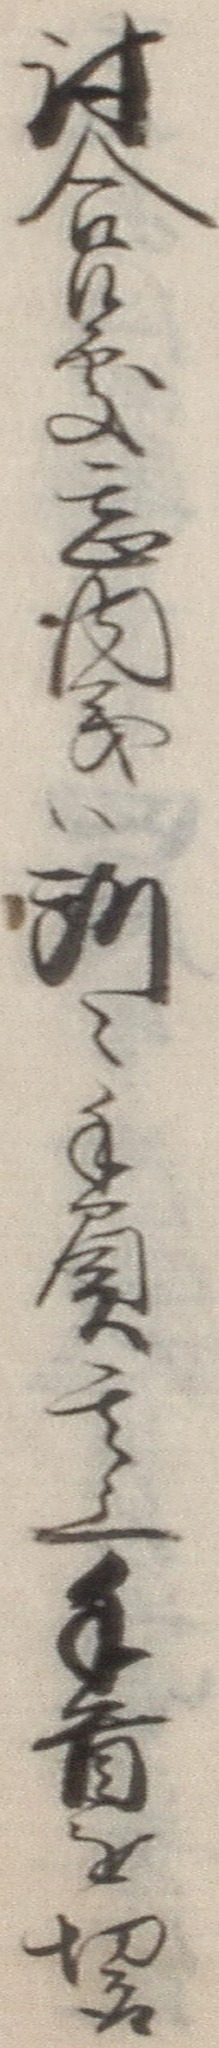討合候処甚内義ハ所々手負其上手首を切取
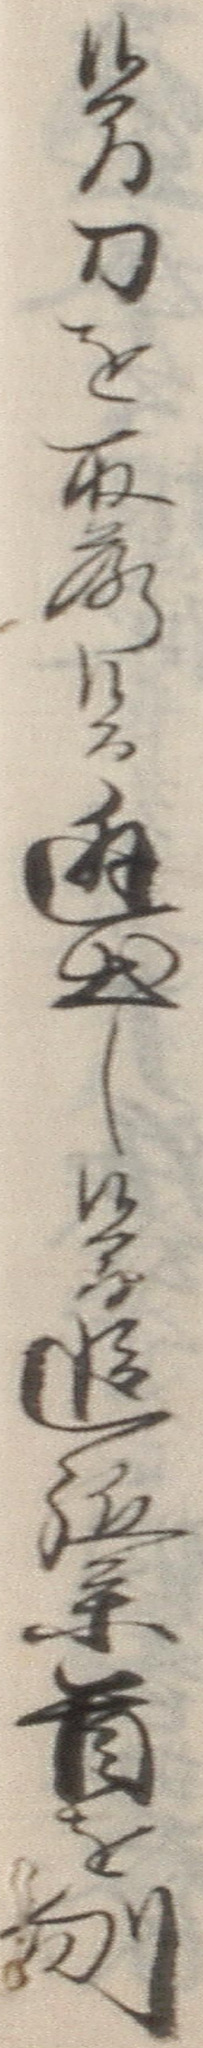候間刀を取落候而逃出し候間追駈参首を刎
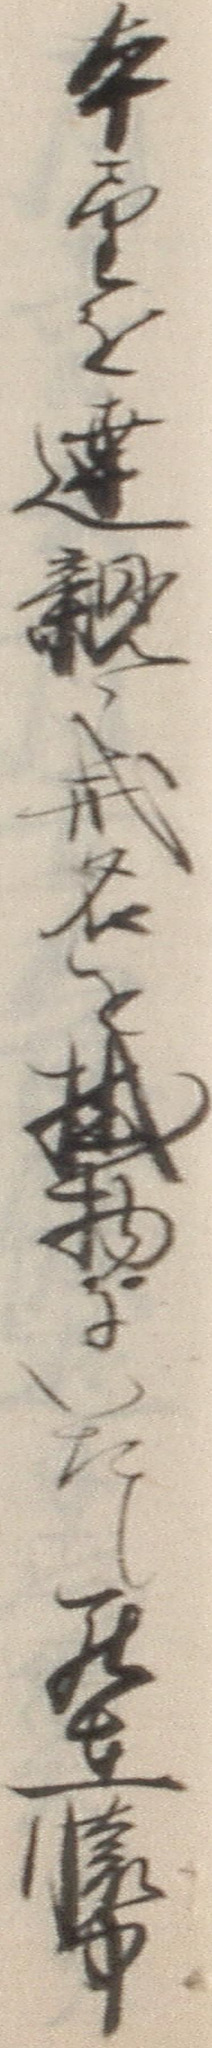本望を達親之戒名を掛物にいたし罷在懐中
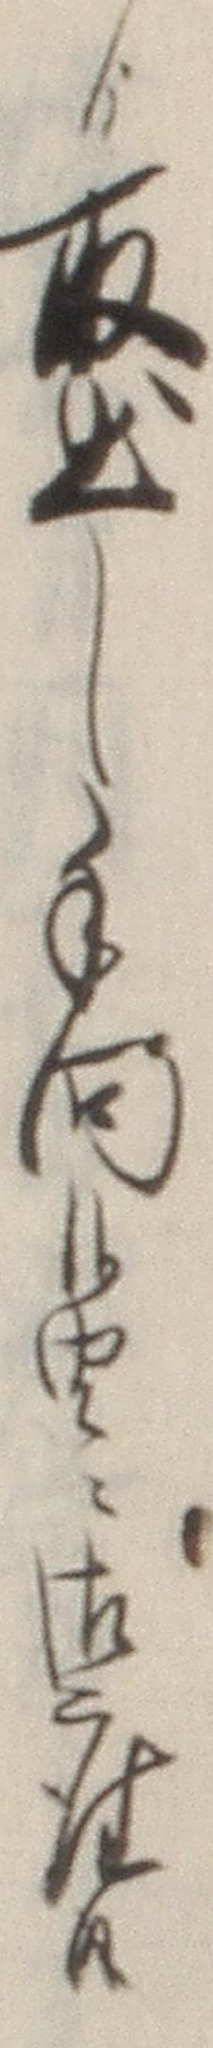ゟ取出し手向候由ニ御座候
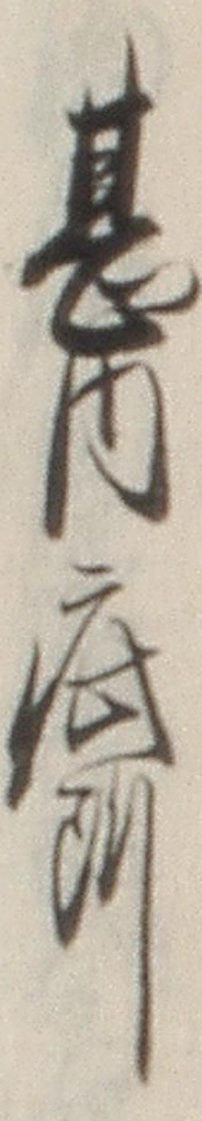甚内疵所
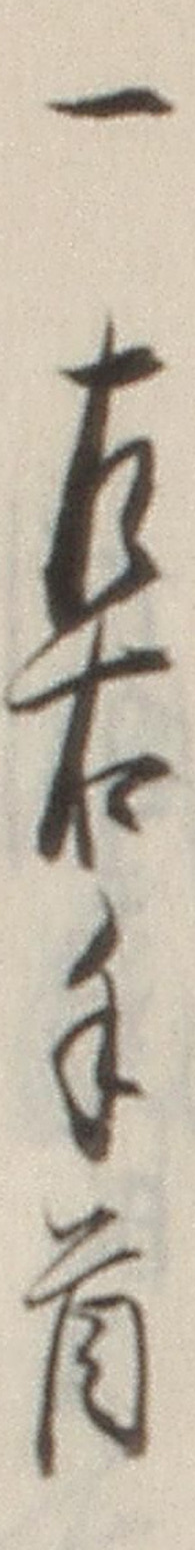一左右手首
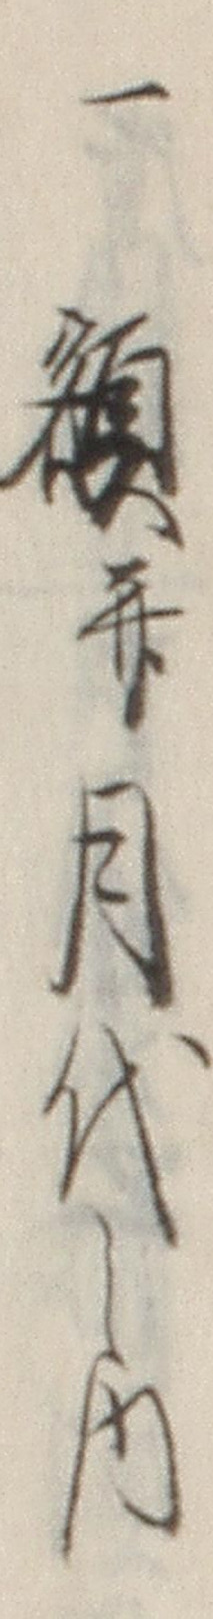一額并月代之内
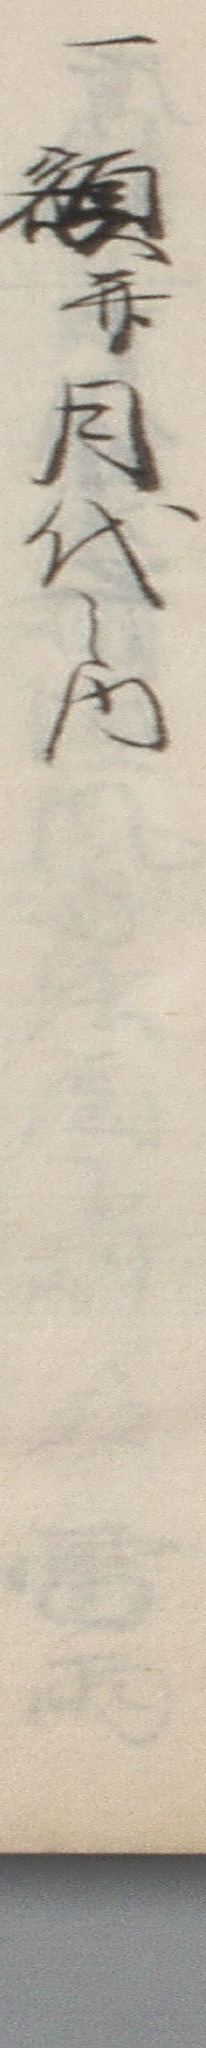一額并月代之内
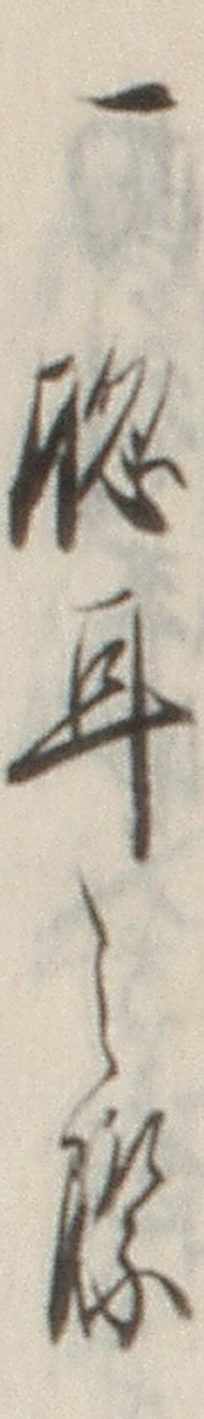一脇耳之際
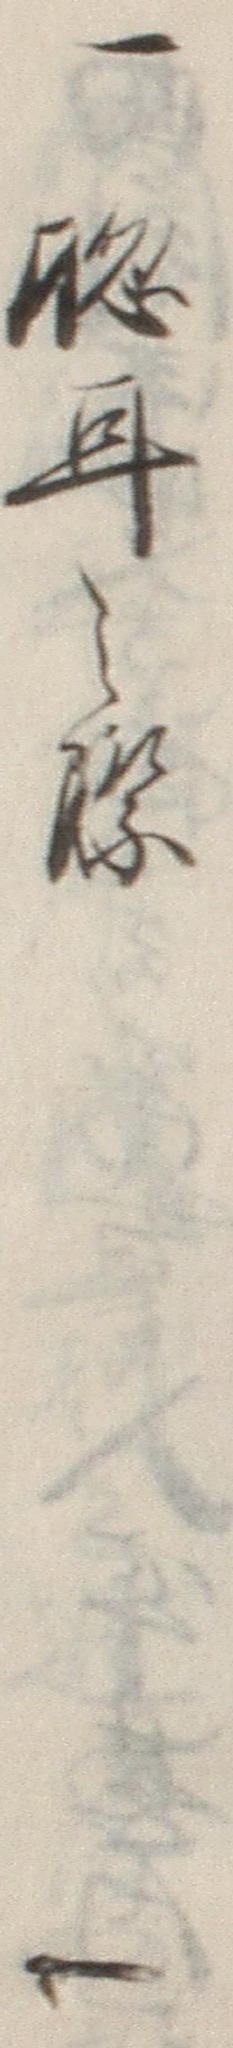一脇耳之際
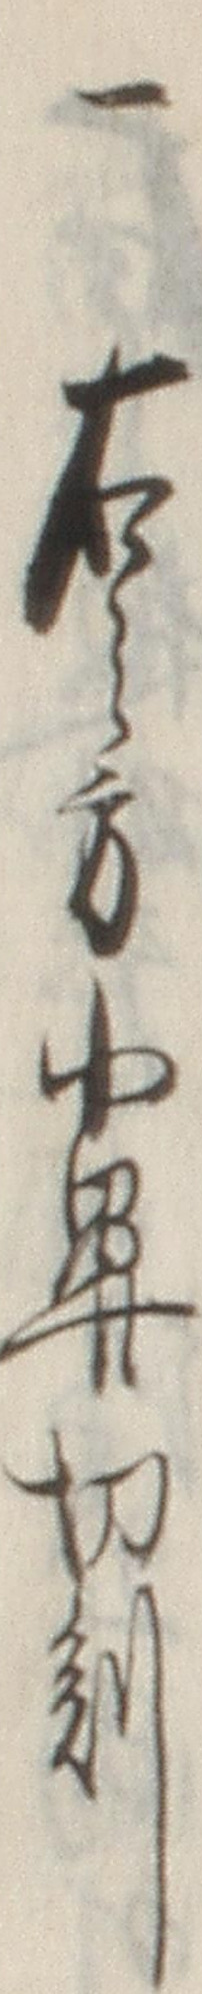一右之方小鼻切刻
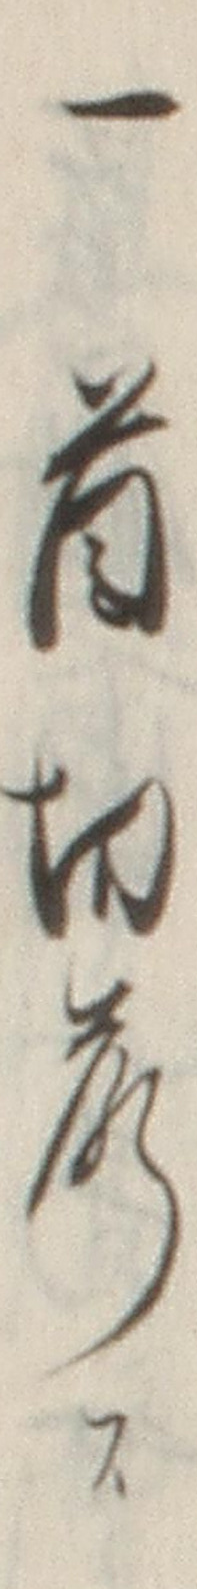一首切落ス
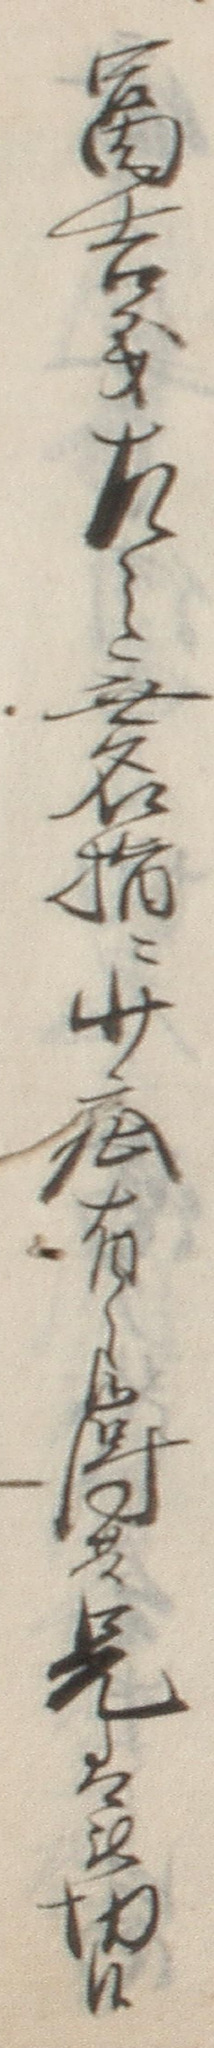富吉義左之無名指ニ少疵有候得共是は被切候
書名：[諸国災害記録]
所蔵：東京大学地震研究所図書室 Earthquake Research Institute Library, The University of Tokyo, JAPAN
